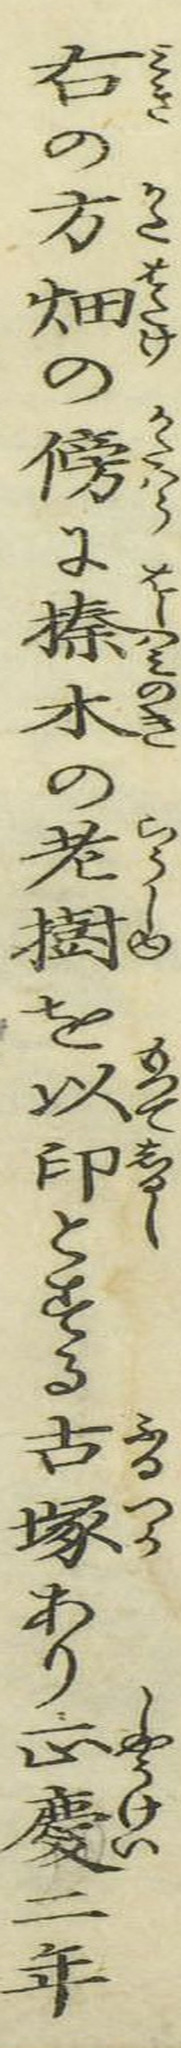右の方畑の傍に榛木の老樹を以印とする古塚あり正慶二年
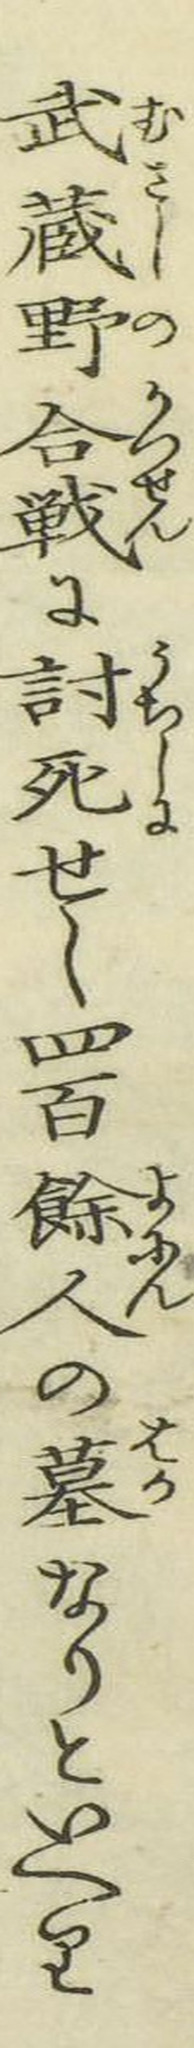武蔵野合戦に討死せし四百余人の墓なりといへり
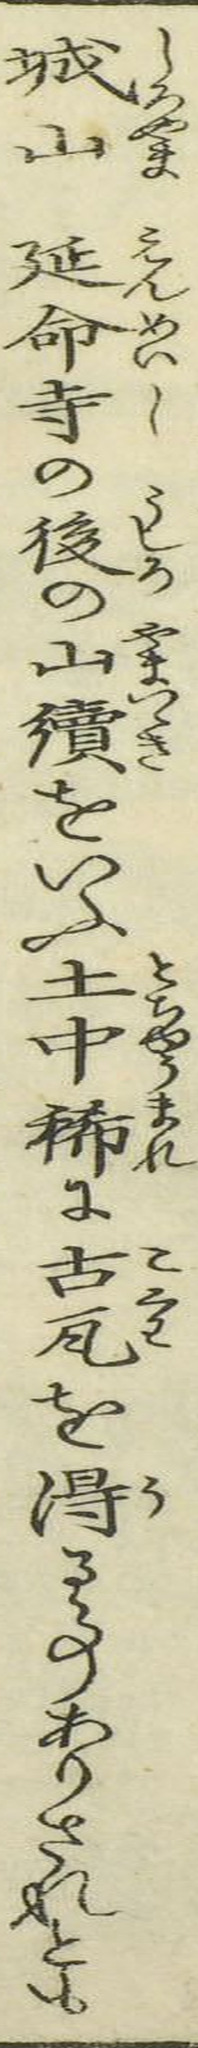城山延命寺の後の山続をいふ土中稀に古瓦を得る事ありされとも
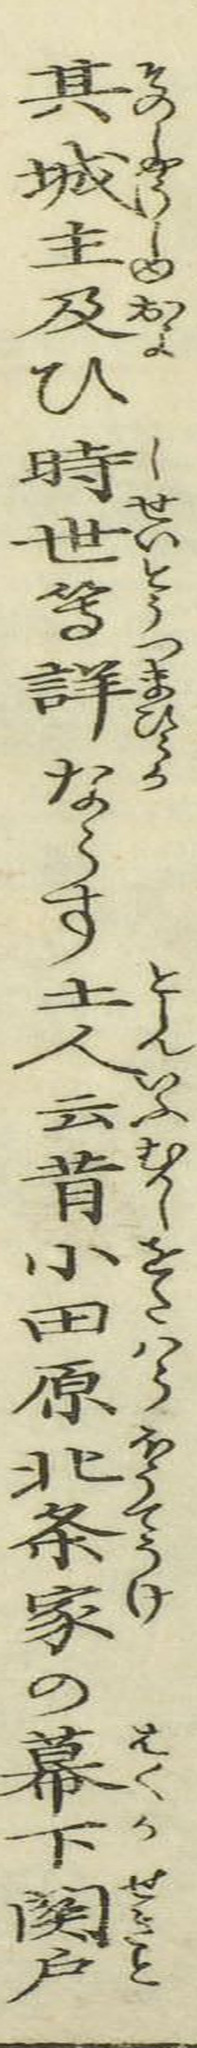其城主及ひ時世等詳ならす土人云昔小田原北条家の幕下関戸
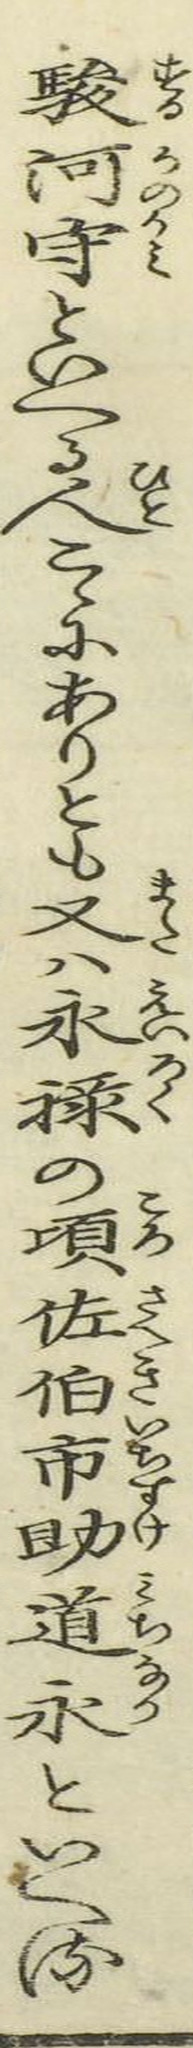駿河守といへる人こゝにありとも又は永禄の頃佐伯市助道永といへる
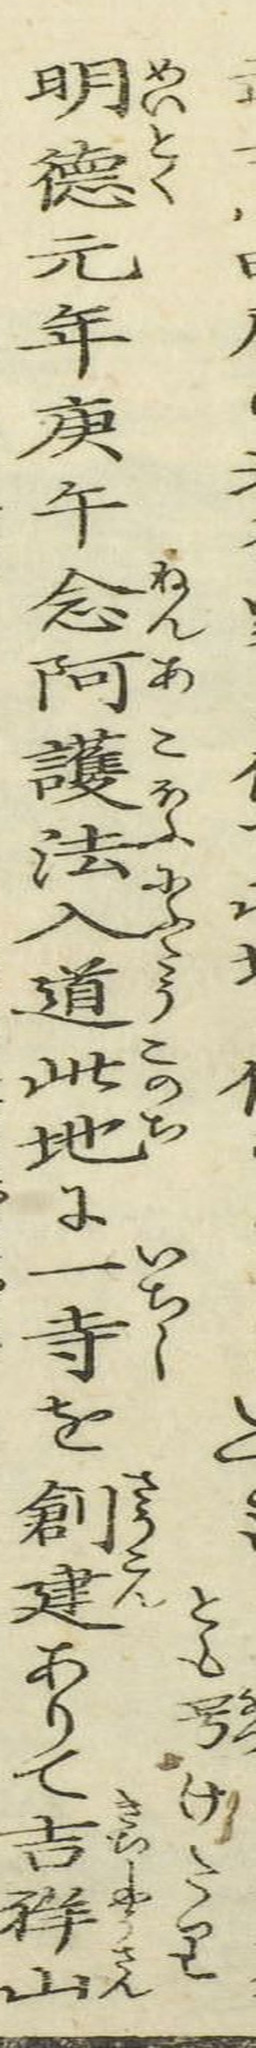明徳元年庚午念阿護法入道此地に一寺を創建ありて吉祥山
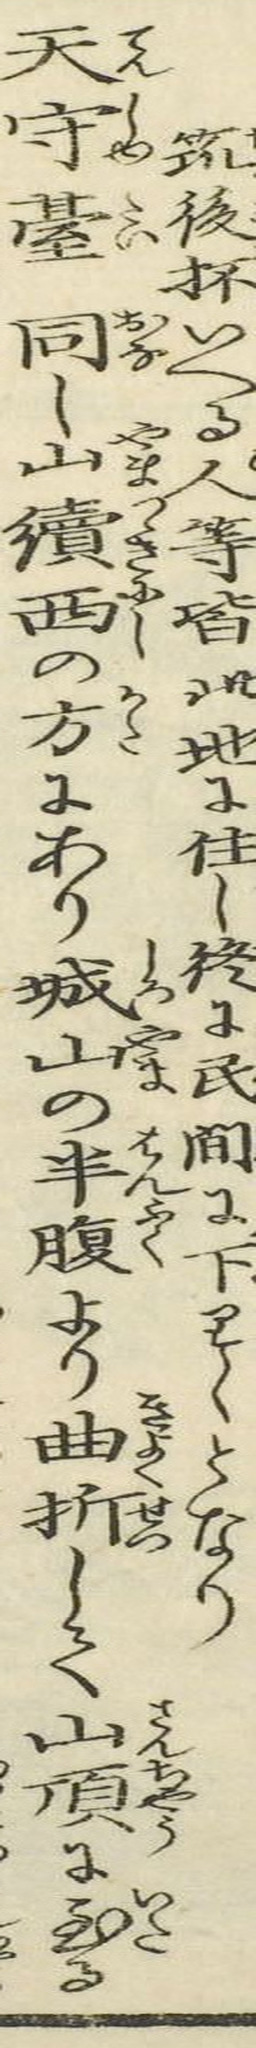天守台同し山続西の方にあり城山の半腹より曲折して山頂に至る
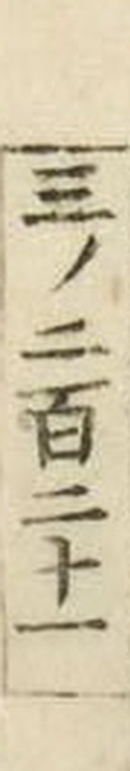三ノ二百二十
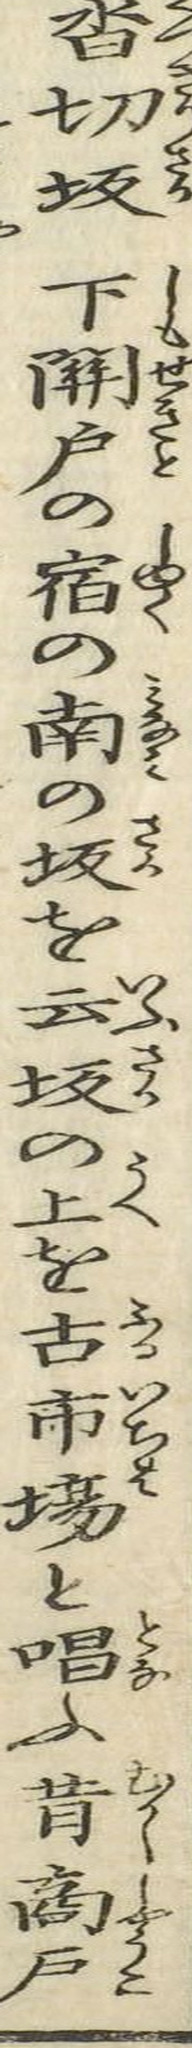沓切坂下関戸の宿の南の坂を云坂の上を古市場と唱ふ昔商戸
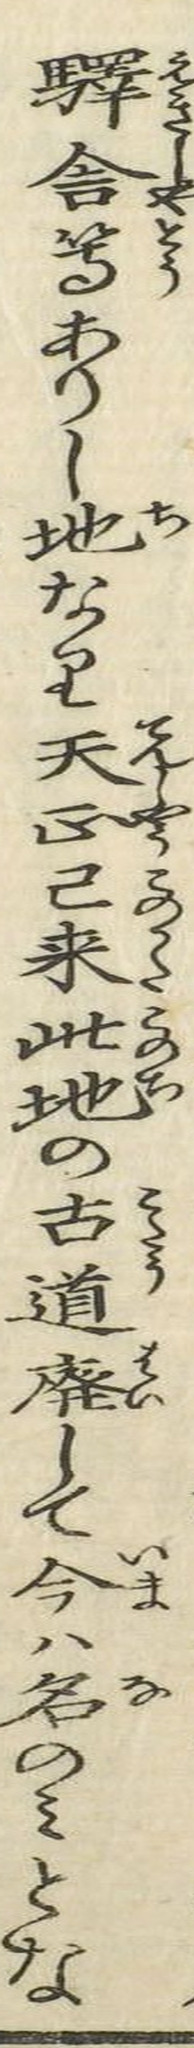駅舎等ありし地なり天正已来此地の古道廃して今は名のみとな
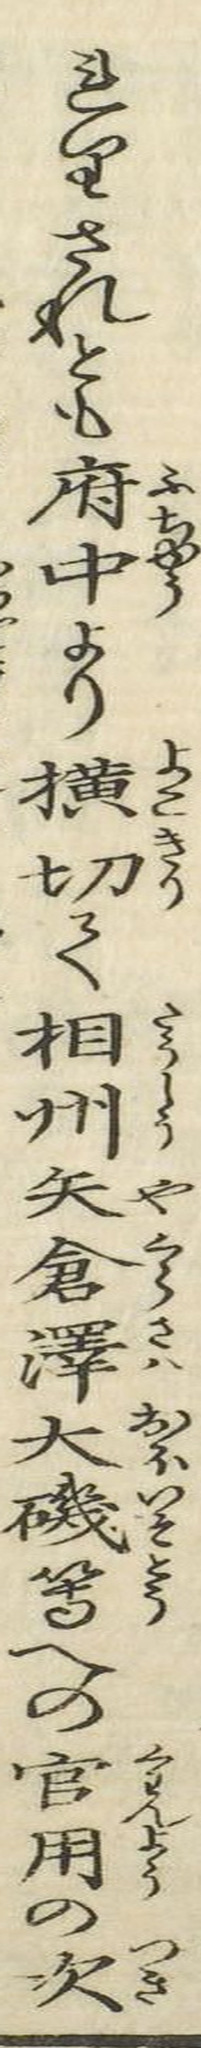れりされとも府中より横切て相州矢倉沢大磯等への官用の次
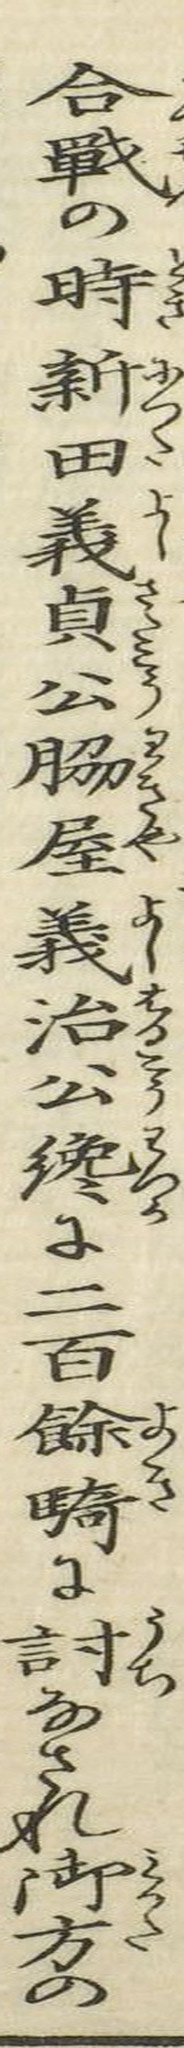合戦の時新田義貞公脇屋義治公纔に二百余騎に討なされ御方の
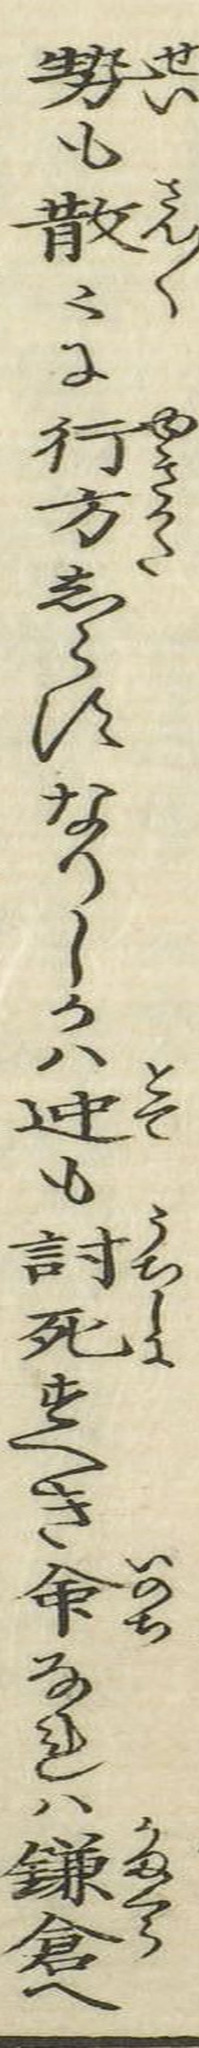勢も散々に行方しらすなりしかは迚も討死すへき命なれは鎌倉へ
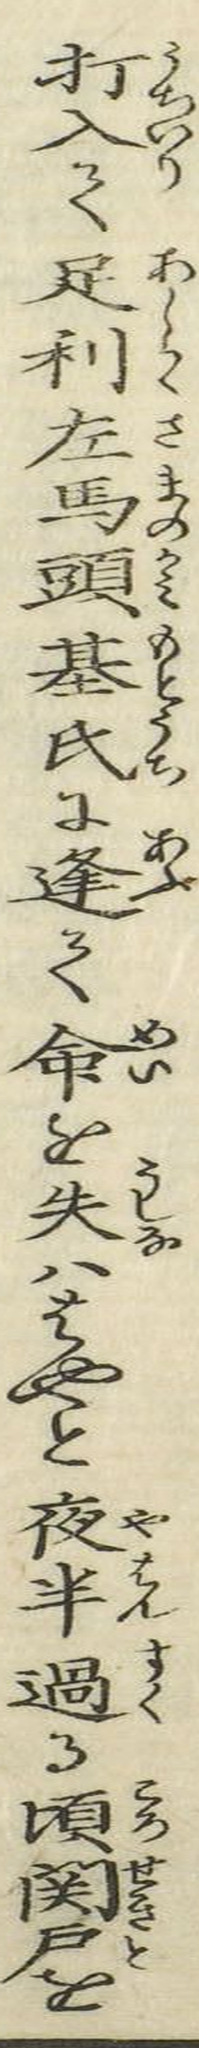打入て足利左馬頭基氏に逢て命を失はやと夜半過る頃関戸を
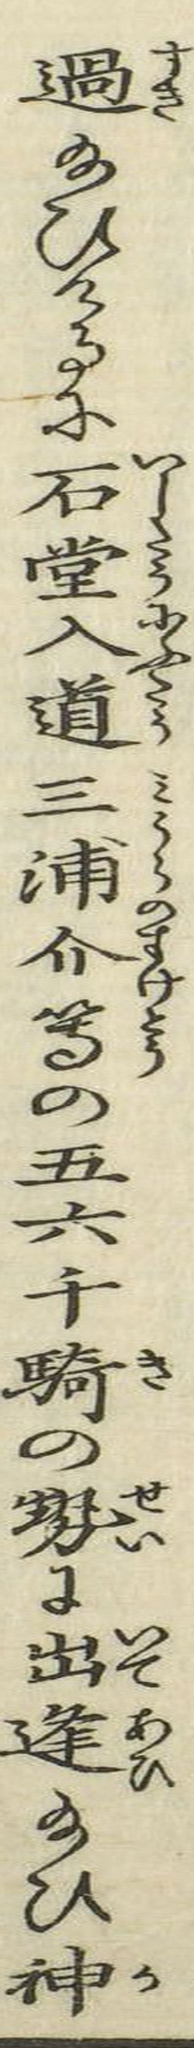過給ひけるに石堂入道三浦介等の五六千騎の勢に出逢給ひ神
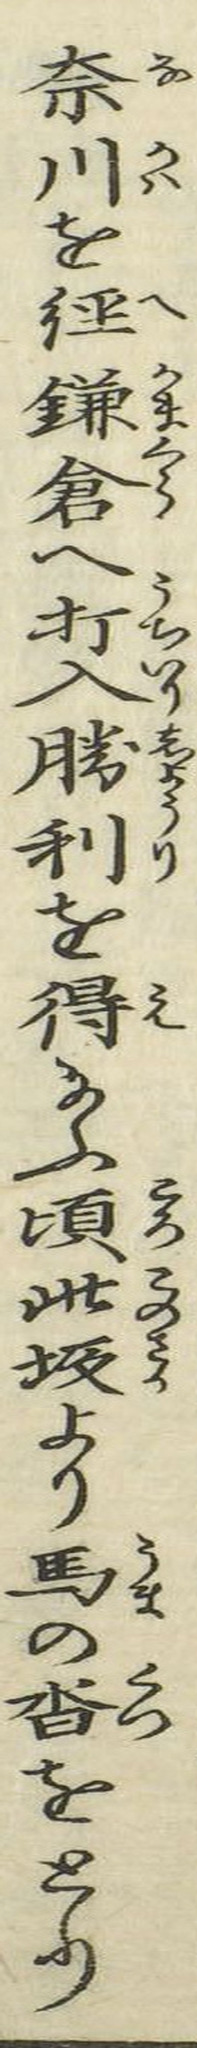奈川を経て鎌倉へ打入勝利を得給ふ頃此坂より馬の沓をとり
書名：江戸名所図会 20巻 巻之10
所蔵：東京学芸大学教育コンテンツアーカイブ
